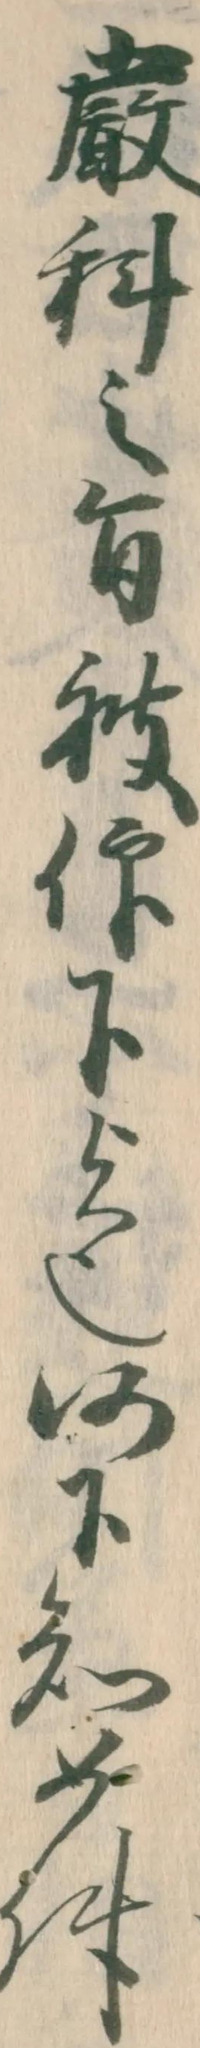厳科之旨被仰下者也仍下知如件
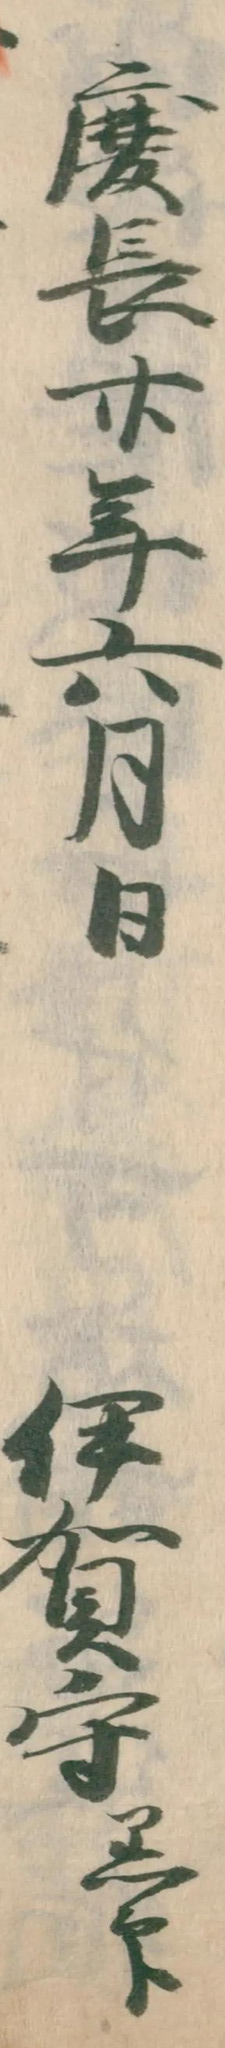慶長廿年六月日伊賀守黒印
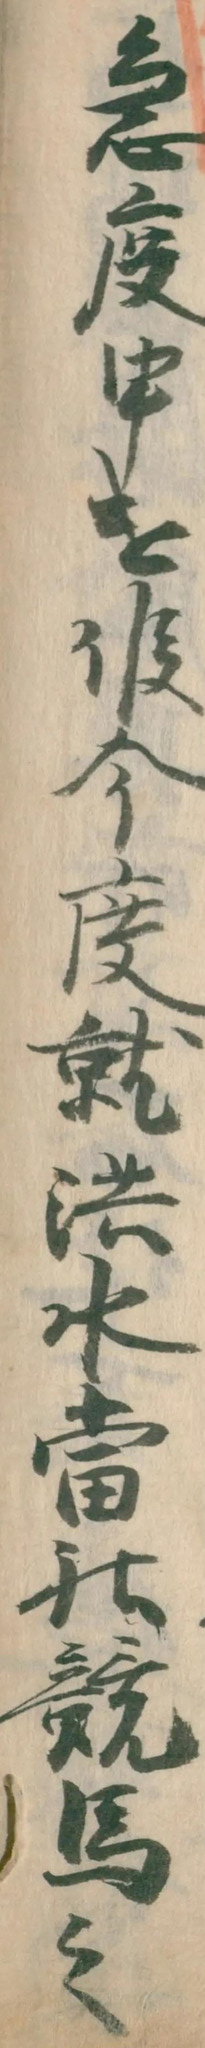急度申遣候今度就洪水当社競馬之

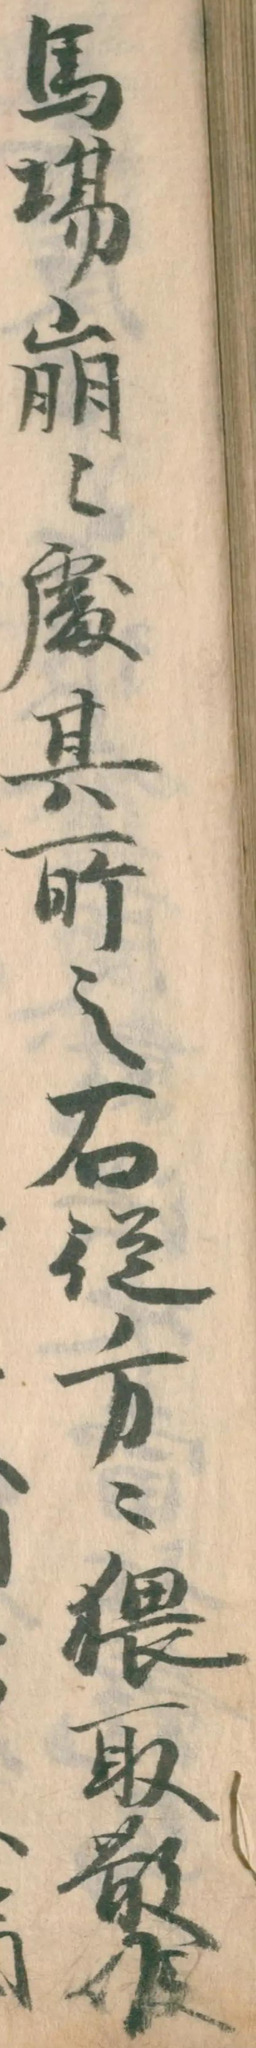馬場崩候処其所之石従方々猥取散候
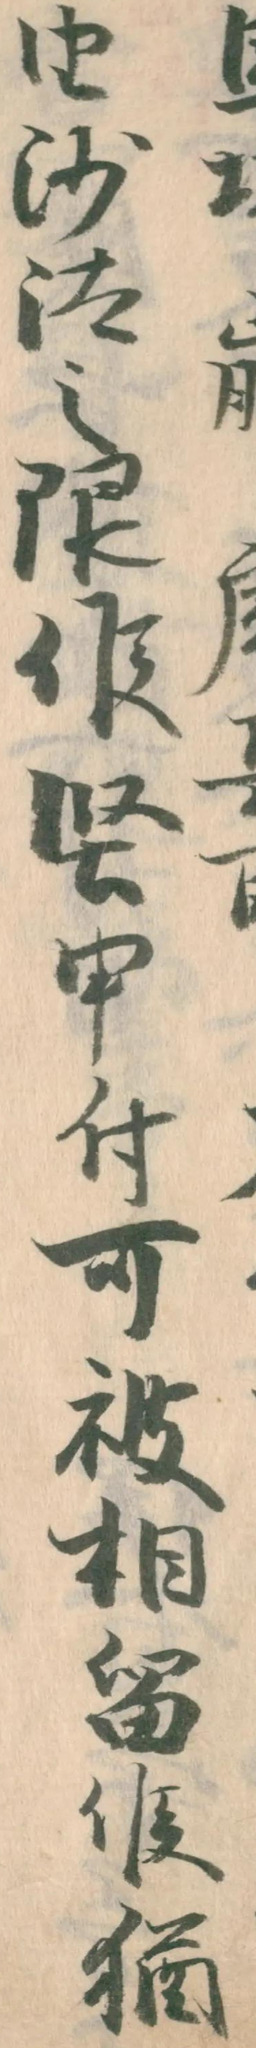由沙汰之限候堅申付可被相留候猶
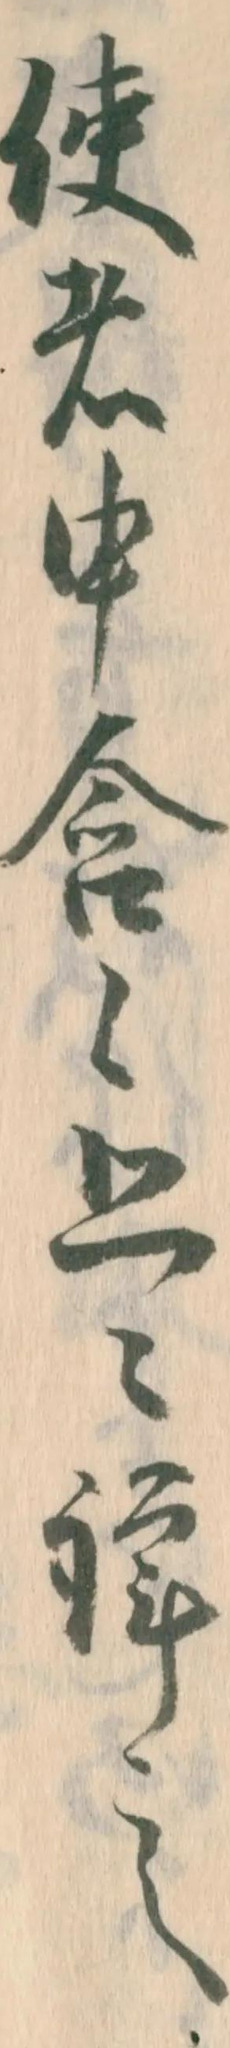使者申含候恐々謹言
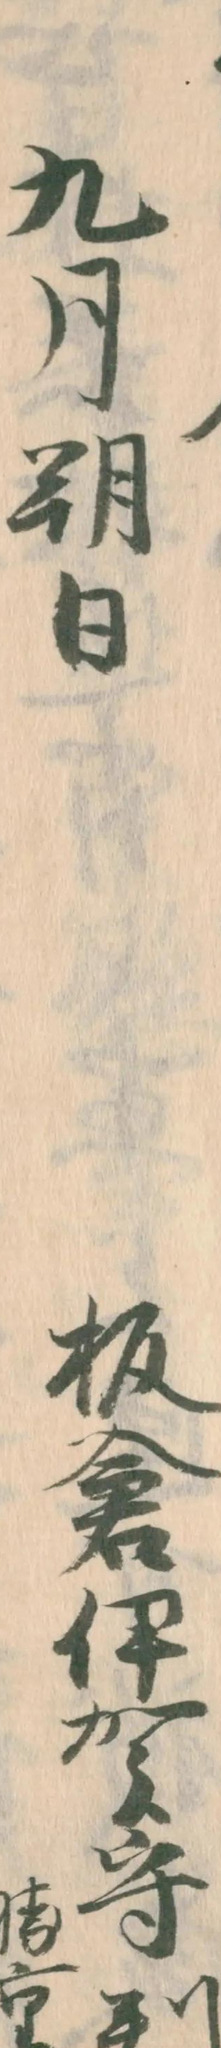九月朔日板倉伊賀守判
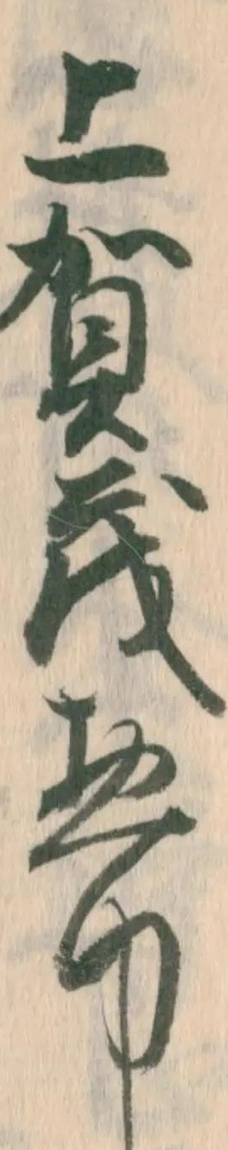上賀茂惣中
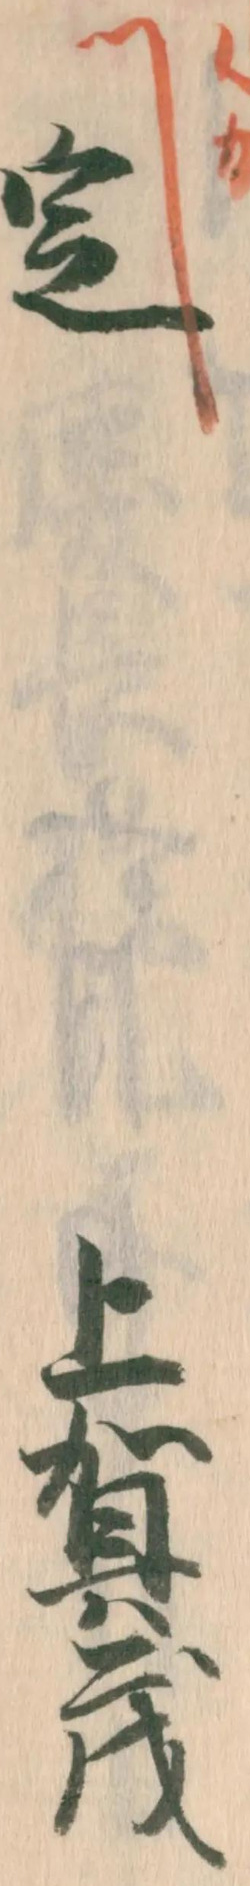定上賀茂
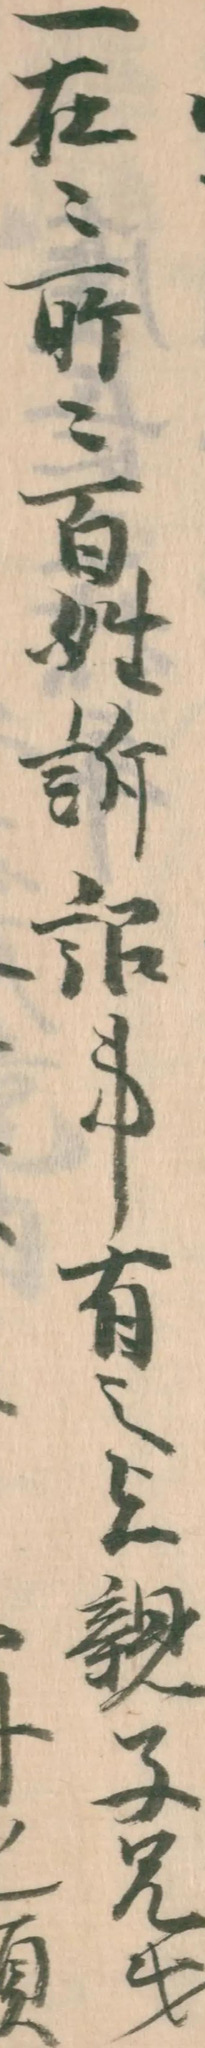一在々所々百姓訴詔事有之者親子兄弟
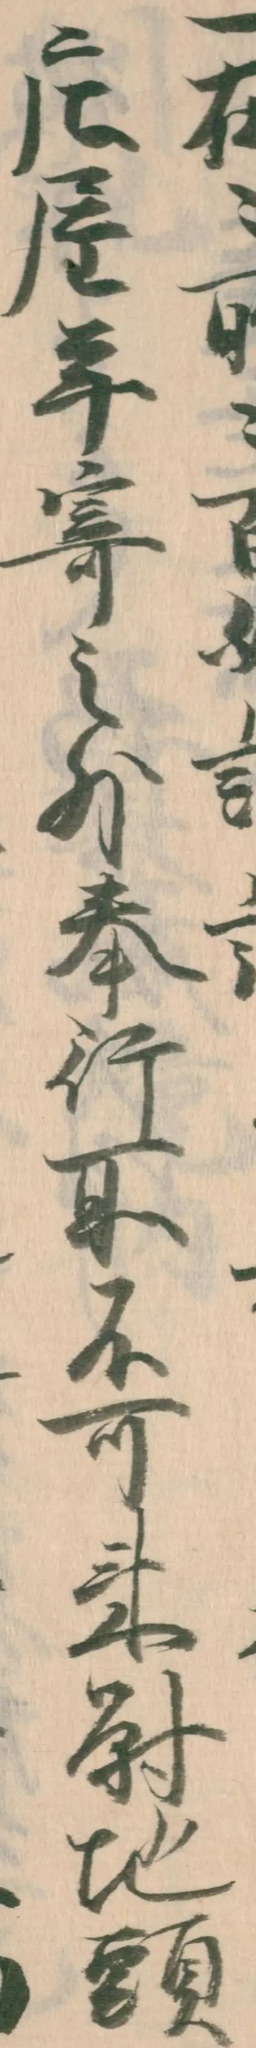庄屋年寄之外奉行所不可来対地頭
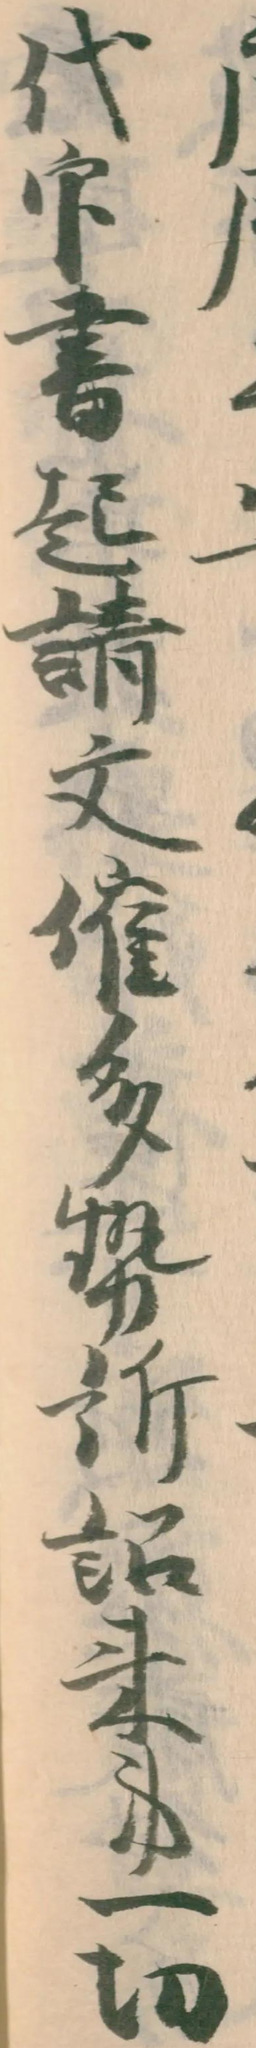代官書起請文催多勢訴詔来事一切
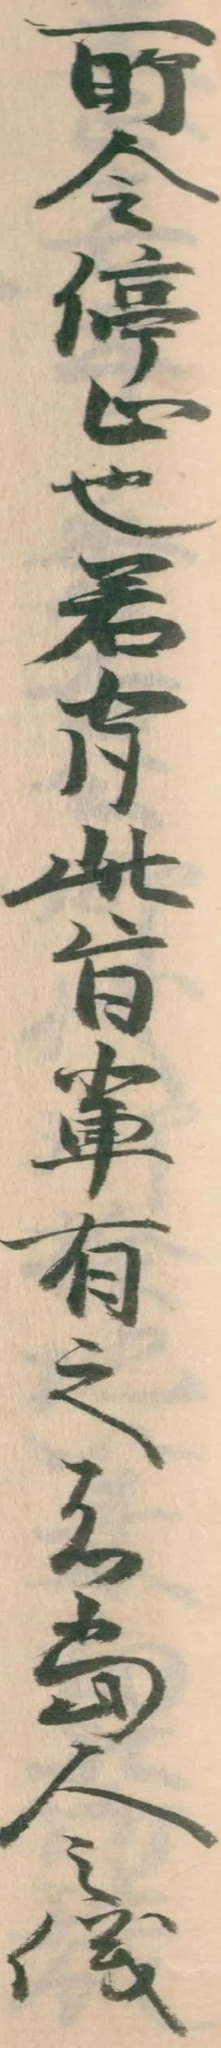所令停止也若背此旨輩有之者当人之儀
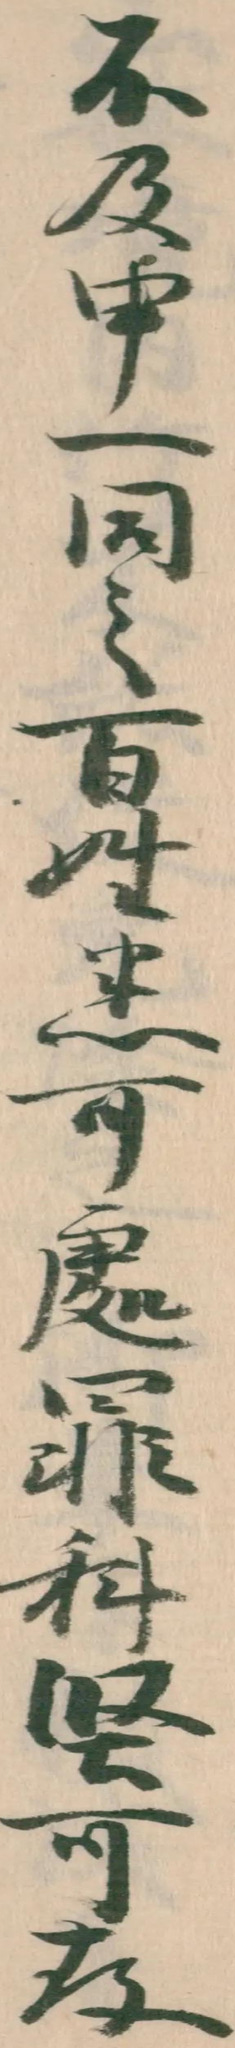不及申一同之百姓悉可処罪科堅可存
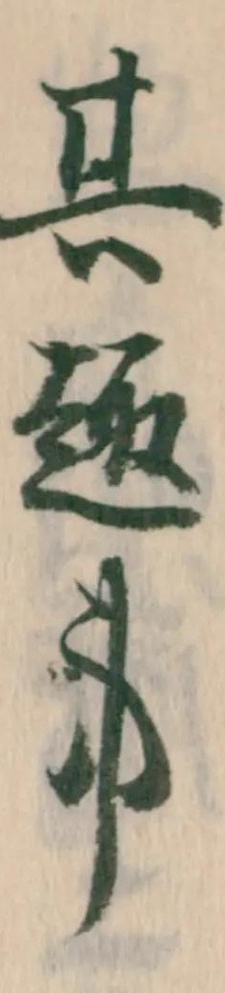其趣事
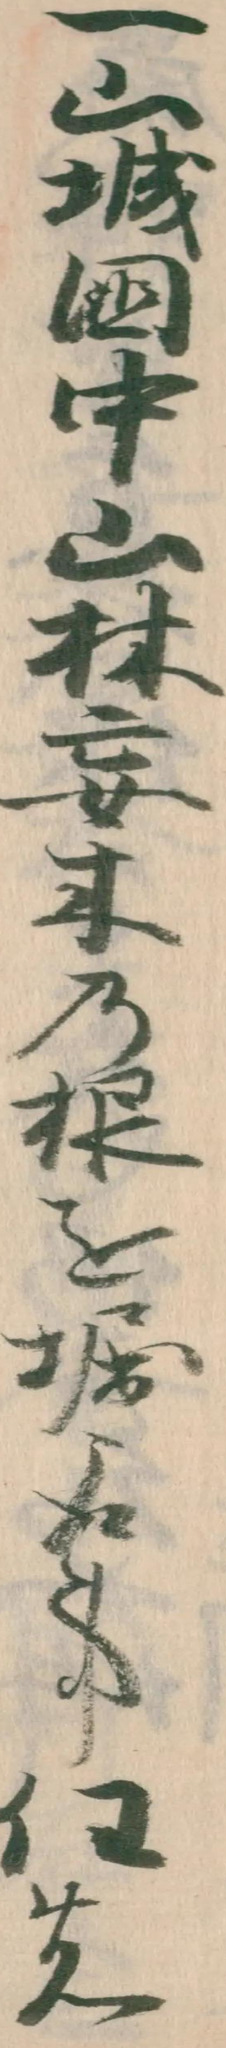一山城国中山林妄木の根を掘取事任先
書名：賀茂社記録. 第1冊
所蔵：国立国会図書館 National Diet Library, JAPAN
